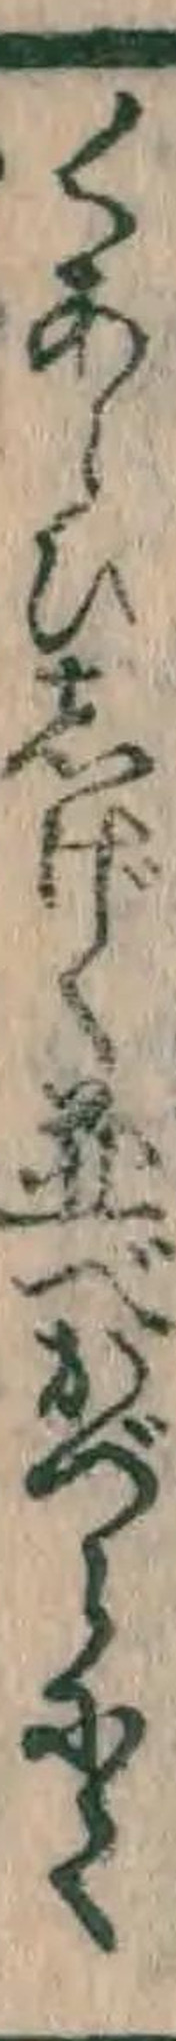くあらひしげく並べかづらにて
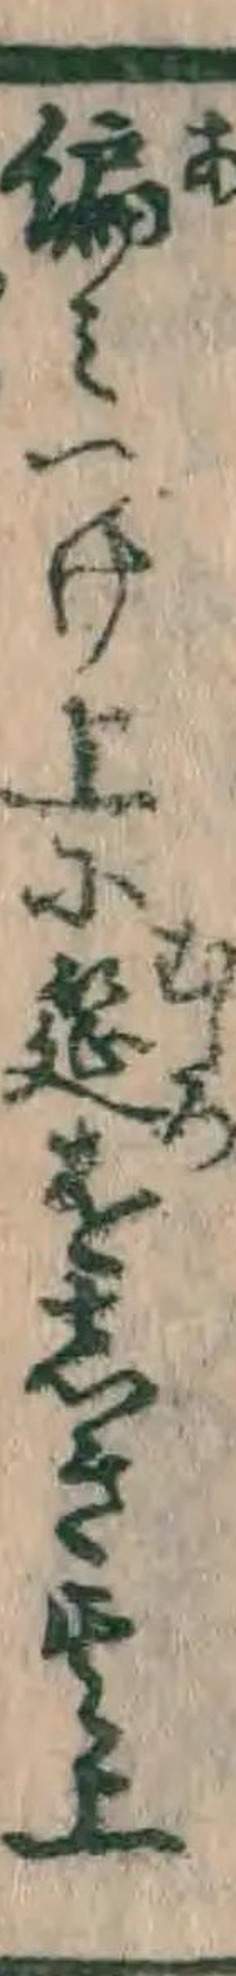編みつけ上に筵をしき其上
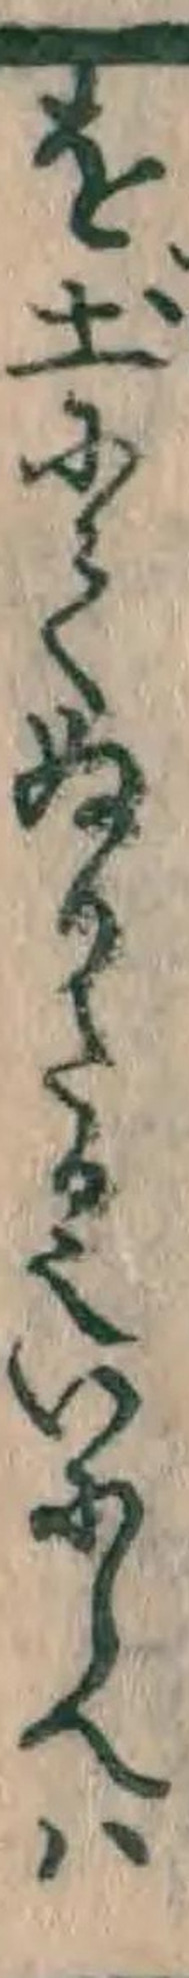を土にてぬりたる也いにしへは
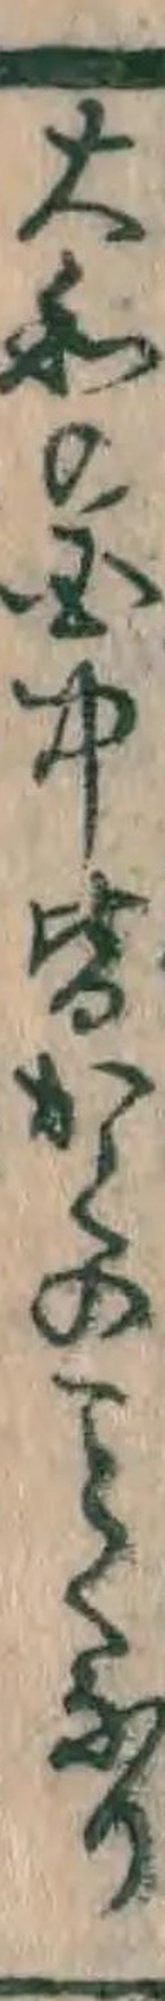大和の国中皆かくのことくなり
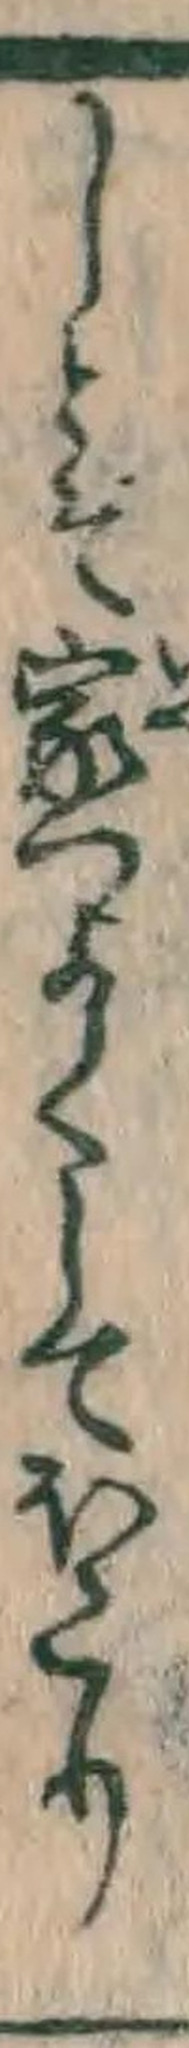しとぞ家つよくしてほこり
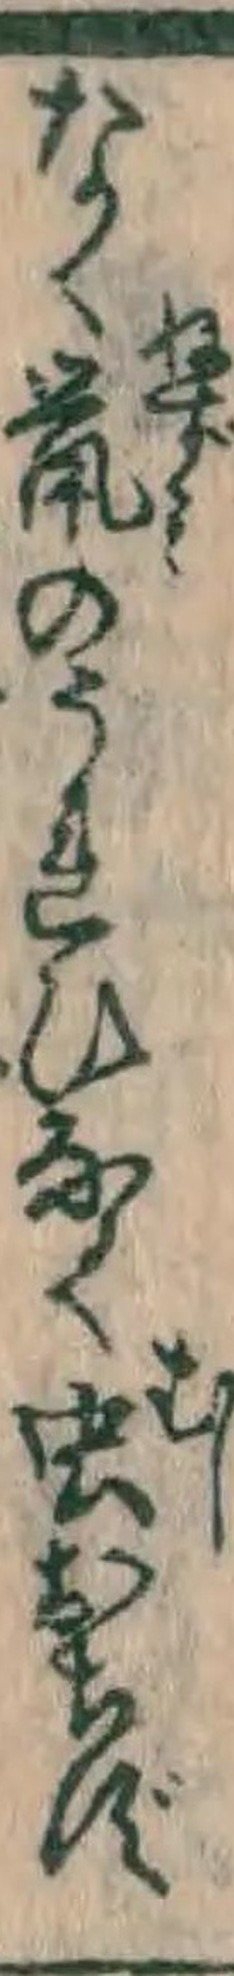なく鼠のうれひなく虫おちず
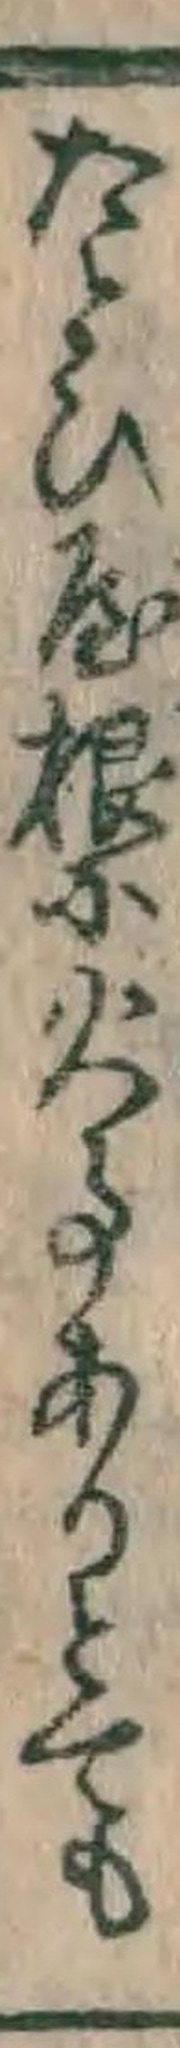たとひ屋根に火事ありとても

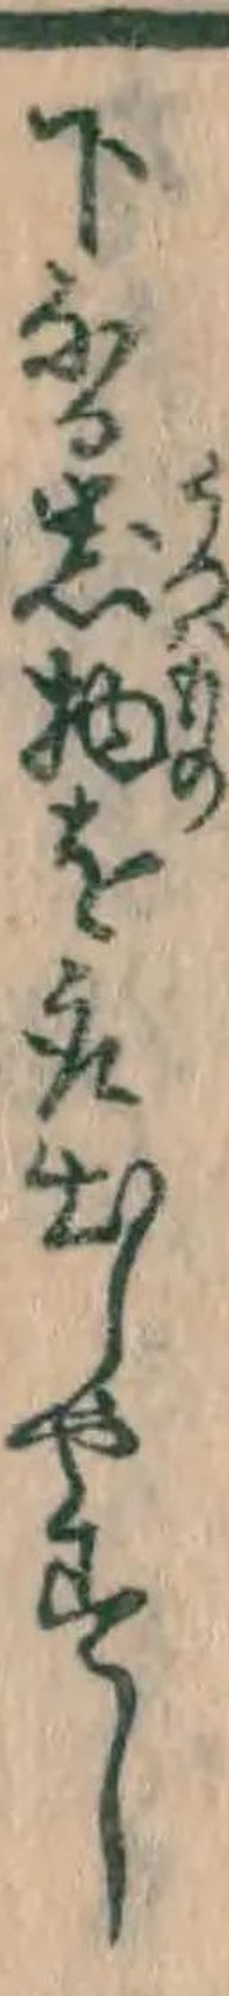下なる器物を取出しやすし
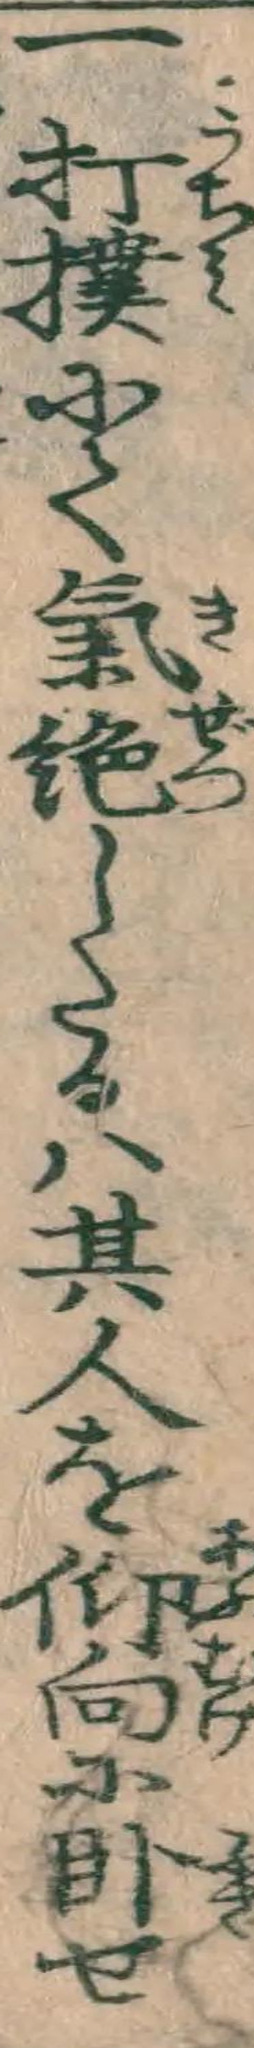一打撲にて気絶したるは其人を仰向に臥せ
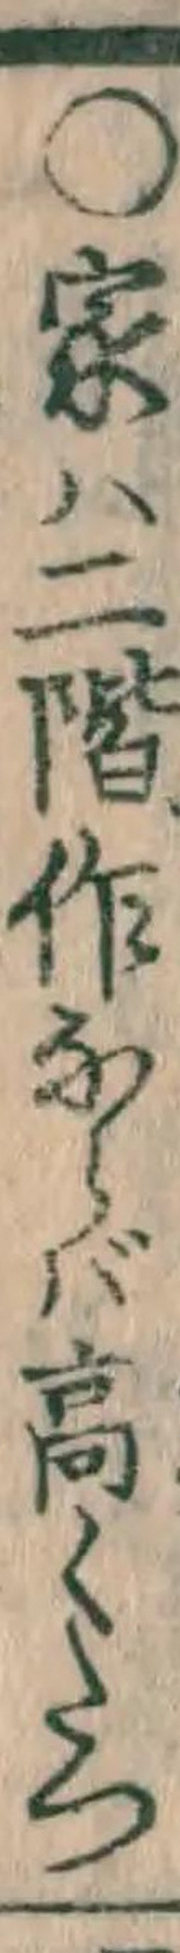○家は二階作ならば高くたつ
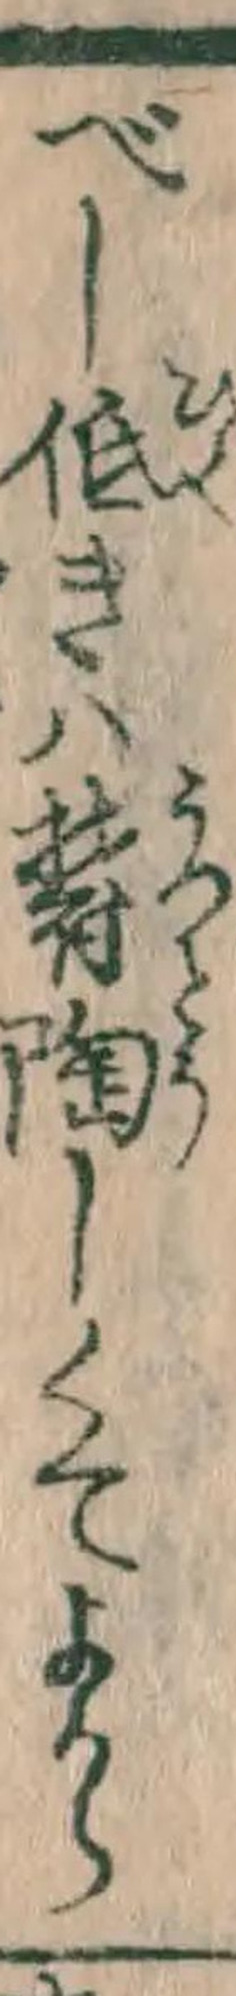べし低きは鬱陶しくてよから
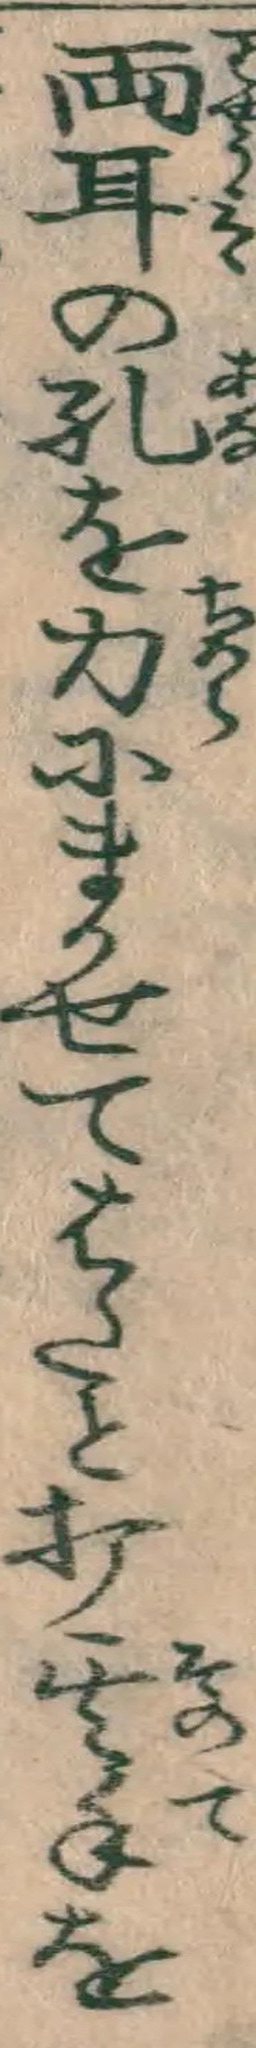両耳の孔を力にまかせてはたと打其手を
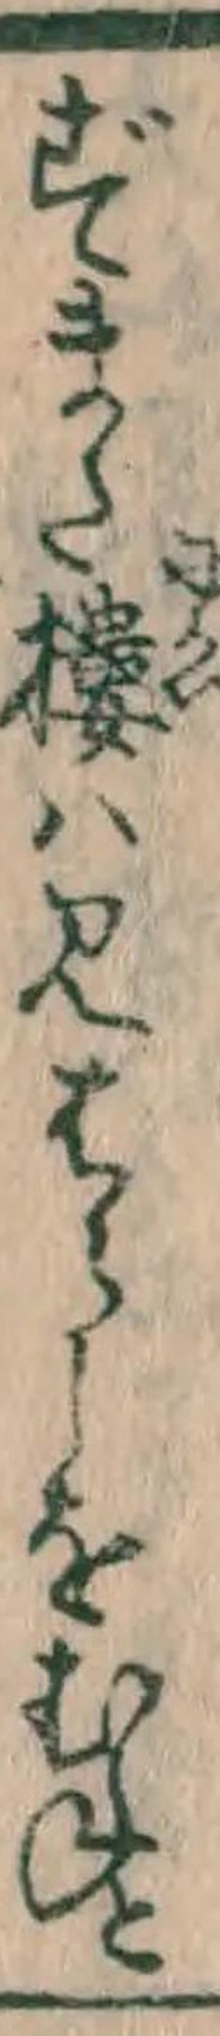ずまた楼は見はらしをむねと
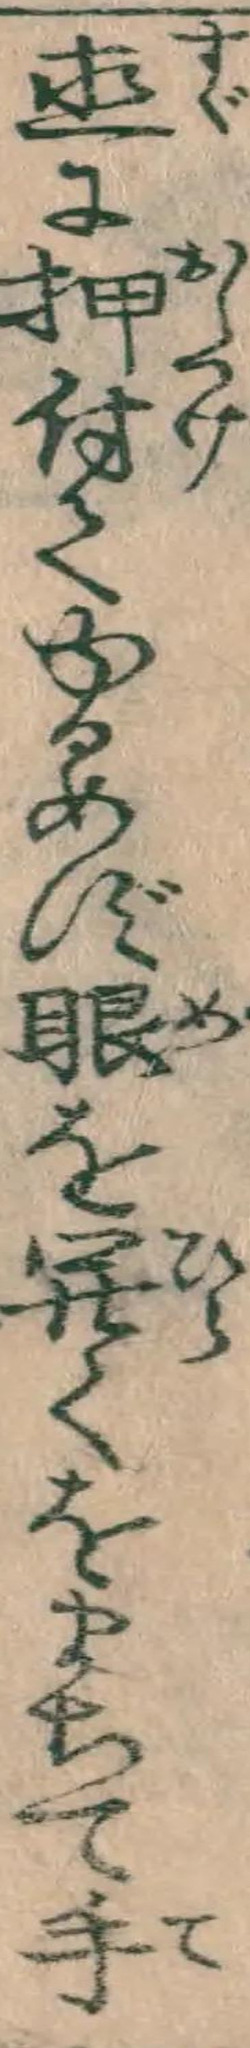直に押付てゆるめず眼を開くをまちて手
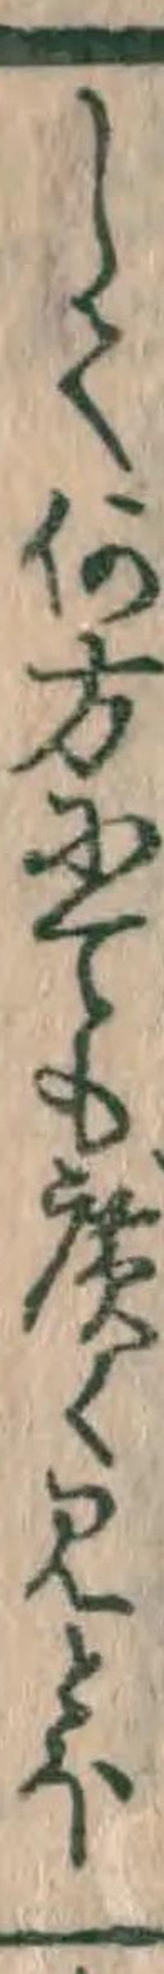して何方にても広く見とほ
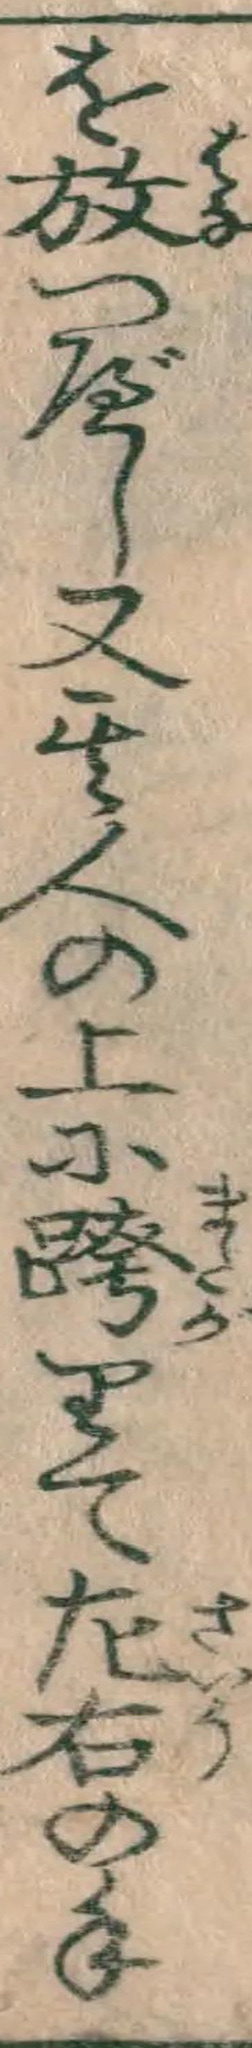を放つべし又其人の上に跨りて左右の手
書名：広益秘事大全 3巻. [3]
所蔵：国立国会図書館 National Diet Library, JAPAN
